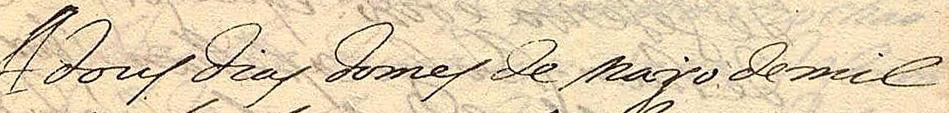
A dous dias do mes de mayo de mil
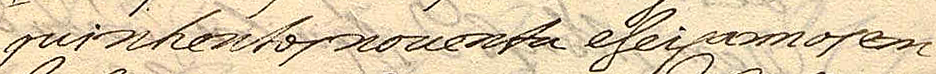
quinhentos nouenta e seis annos em
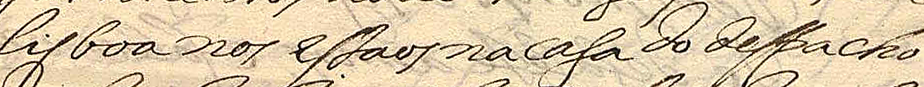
lisboa nos Estaos na casa do despacho
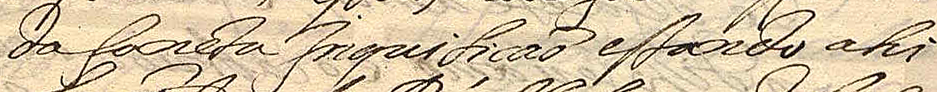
da sancta Jnquisiçaõ estando ahi
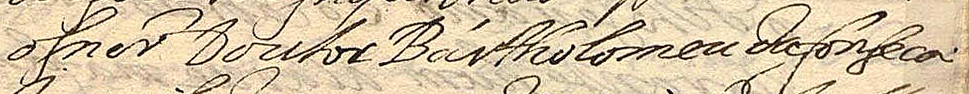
o snor̄ Doutor Bartholomeu da fonseca
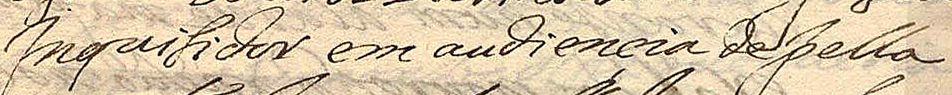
Jnquisidor em audiencia de pella
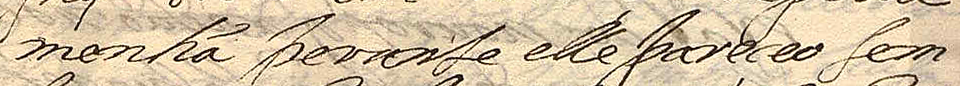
menhā perante elle pareceo sem
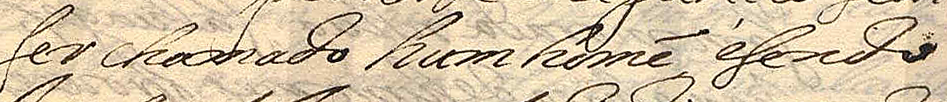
ser chamado hum homē e sendo
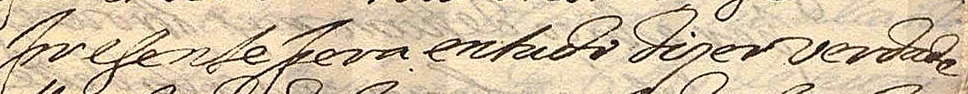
presente pera en tudo dizer verdade
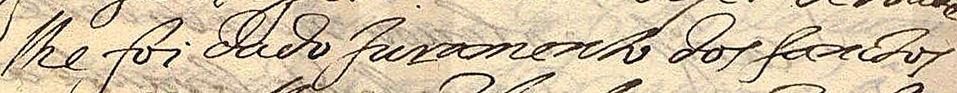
lhe foi dado Juramento dos sanctos
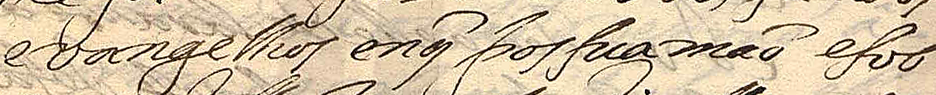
evangelhos en q̄ pos sua maõ e sob
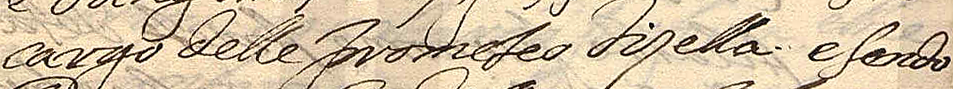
cargo delle prometeo dizella. e sendo
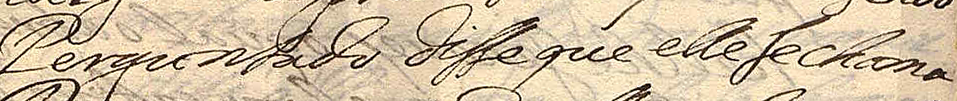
Perguntado disse que elle se chama
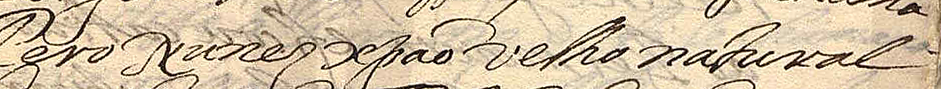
Pero Nunez xpaõ velho natural
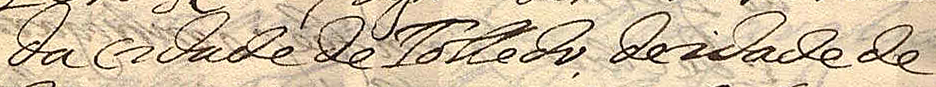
da cidade de Tolledo, de idade de
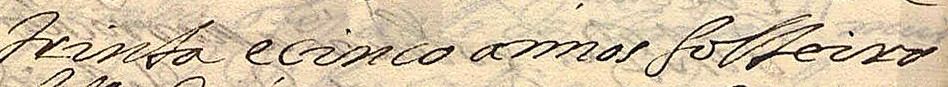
trinta e cinco annos solteiro
